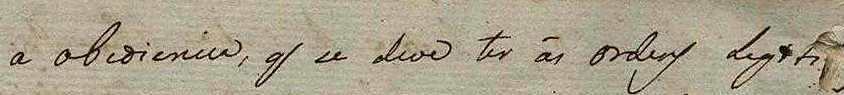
a obediencia, q̄ se deve ter ás ordens Legiti__
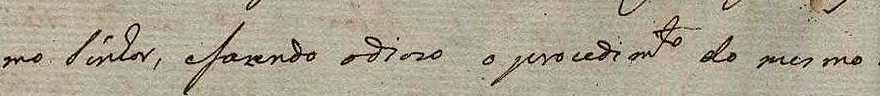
mo Sênhor, e fazendo odiozo o procedimto do mesmo
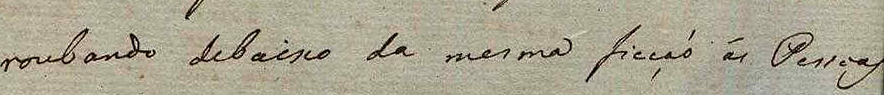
roubando debaixo da mesma ficçaõ às Pessoas
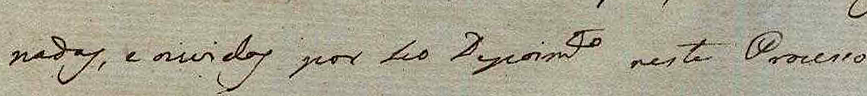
nadas, e ouvidas por seo Depoim.to neste Processo
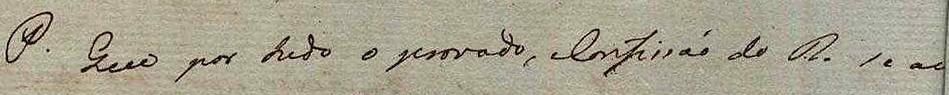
P. Que por tudo o provado, e Confissaõ do R. se ac
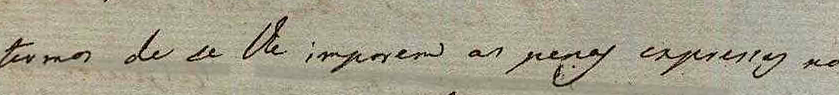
termos de se lhe imporem as penas expressas no
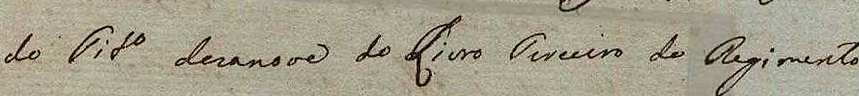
do Tit.o dezanove do Livro Terceiro do Regimento
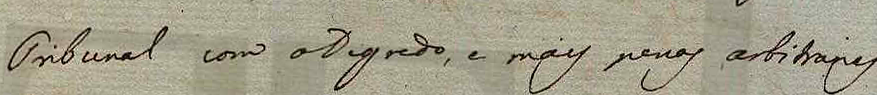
Tribunal com o Degredo, e mais penas arbitrarias
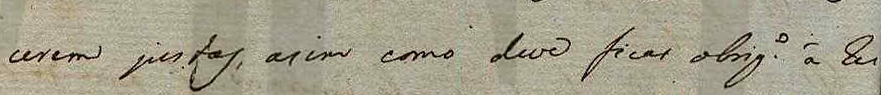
cerem justas, asim como deve ficar obrig.o á hu
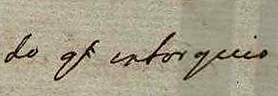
do q̄ extorquio.
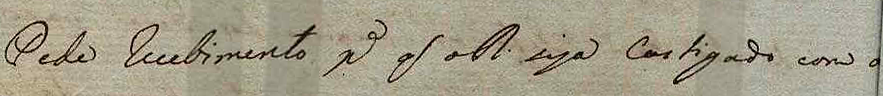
Pede Recebimento p.a q̄ o R. seja castigado com o
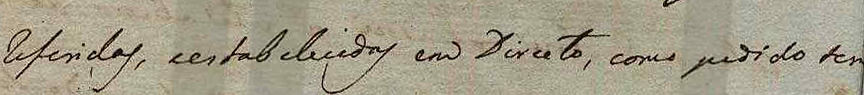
Referidas, e estabelecidas em Direito, como pedido ter
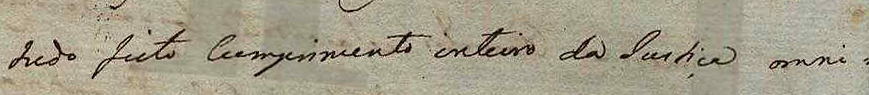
tudo feito cumprimento inteiro da Iustiça omni
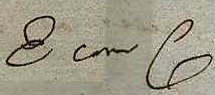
E com C.
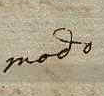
modo
